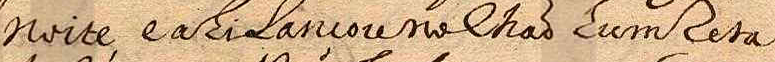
noite, e ahi Lançou no Chaõ hum Reta
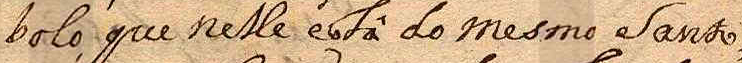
bolo, que nelle está do mesmo Santo,
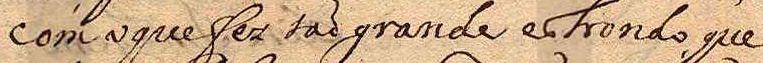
com o que fez taõ grande estrondo, que
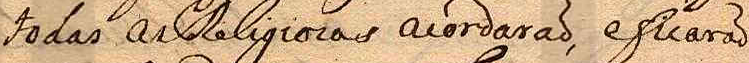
todas as Religiozas acordaraõ, e ficaraõ
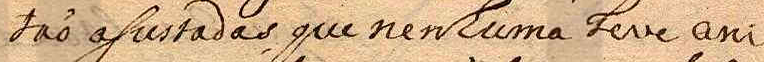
taõ asustadas, que nenhuma teve ani
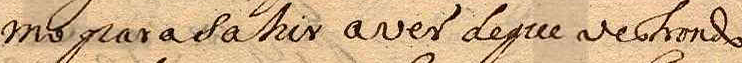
mo para sahir a ver de que o estrondo
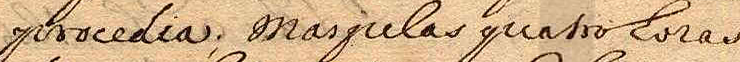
procedia; mas pelas quatro horas
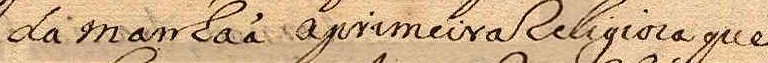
da manhaã a primeira Religioza, que
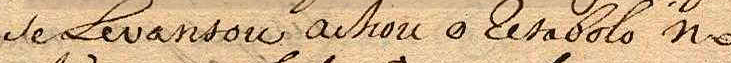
se Levantou achou o Retabolo no
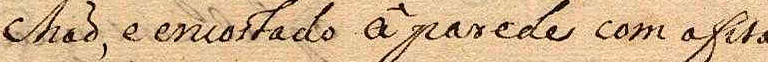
chaõ, e encostado â parede com a fita
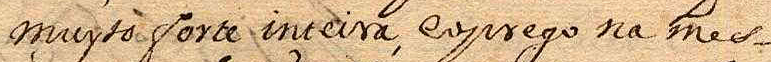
muyto forte inteira, e o prego na mes
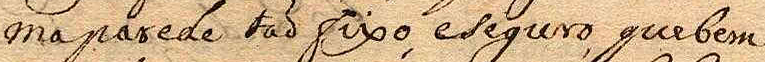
ma parede taõ fixo, e seguro, que bem
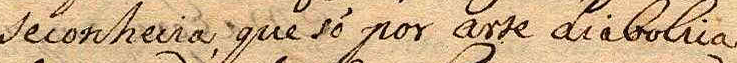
se conhecia, que só por arte diabolica
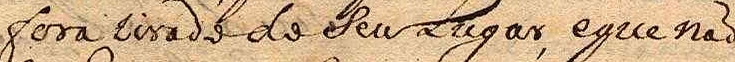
fora tirado do seu Lugar, e que naõ
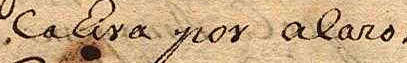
cahira por aCazo.
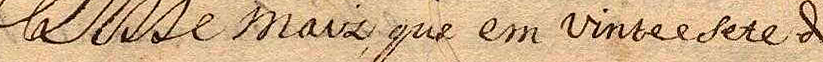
Disse maiz, que em vinte e sete d
